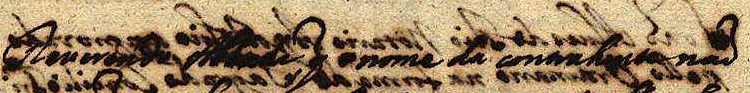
Reverendo Abbade, q̄ o nome da contrahente naõ
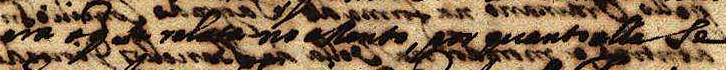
era o q̄ se relata no assento, porquanto ella se
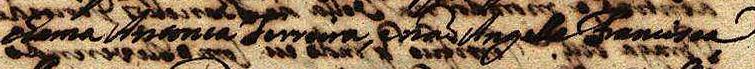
chama Antonia Ferreira, e naõ Angela Francisca
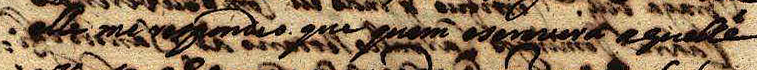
elle me respondeo que quem escreuera aquelle
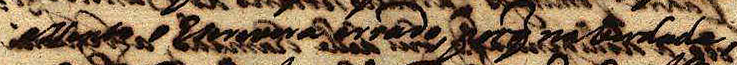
assento, o Escrevera errado, porq̄ na verdade
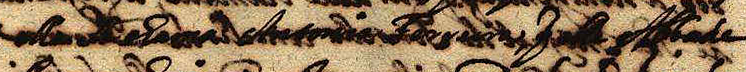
ella se chama Antonia Ferreira, q̄ elle Abbade
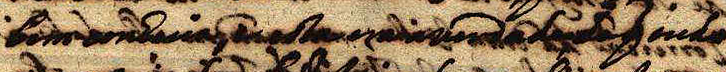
bem conhecia, e esta era a verdade de q̄ tudo
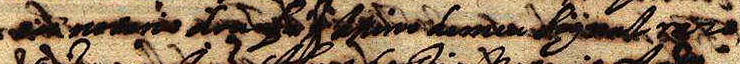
eu notario dou fe q̄ assim de meu signal razo
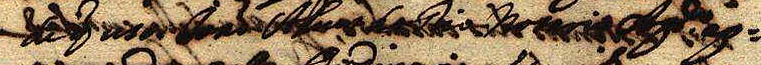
de q̄ uso Ioaõ Alues do Rio notario Ap.co ap
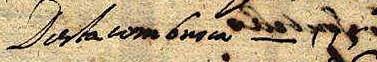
Desta com busca - 175
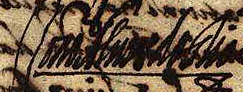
Joaõ Alues do Rio
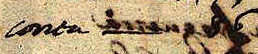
conta - 36
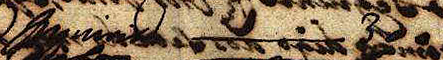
Inquirir - 300
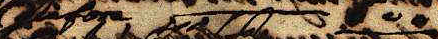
dia fora - 600
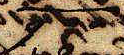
900
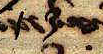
130
